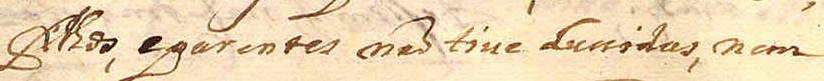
filhos, e parentes naõ tiue duuidas, nem
